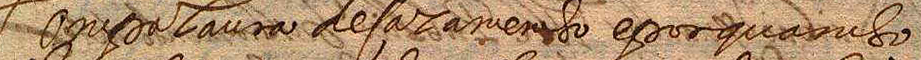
Com palaura de Cazamento e porquamto
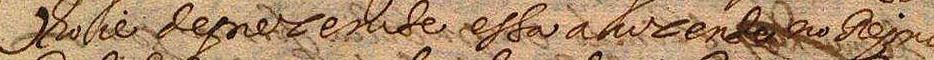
hoie de prezemte esta auzente no Rejno
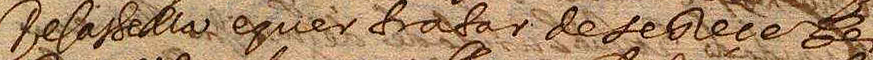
de Castella e quer tratar de se Reçeber
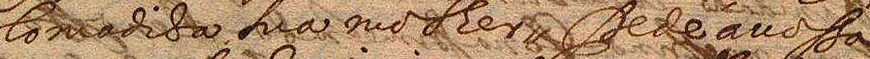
Com a dita sua molher // Pede a uossa
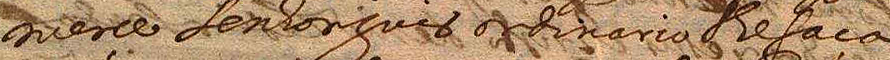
merçe senhor juis ordinario lhe faça
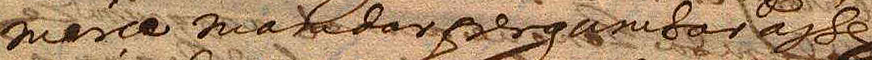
merçe mamdar pergumtar as tes
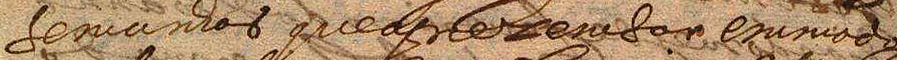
temunhas que aprezemtar em modo
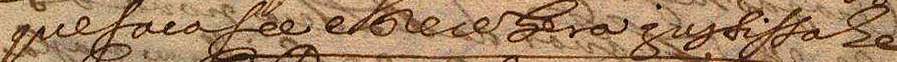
que faca fee e Recebera justissa he
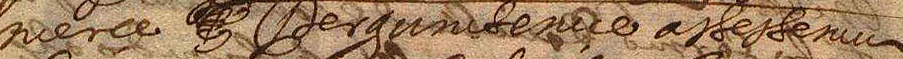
merçe ⁋ Pergumtemçe as testemu
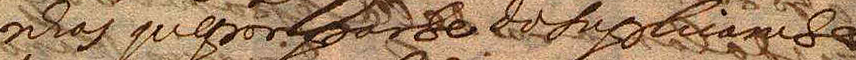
nhas que por parte do suplicamte
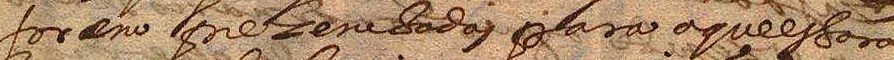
forem prezemtadas para o que estara
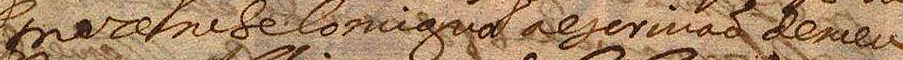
prezemte Comiguo o escriuaõ de meu
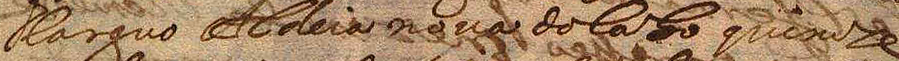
Carguo Aldeia noua do Cabo quimze
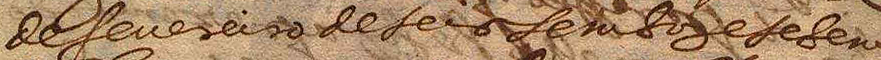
de feuereiro de seissemtos e sesem
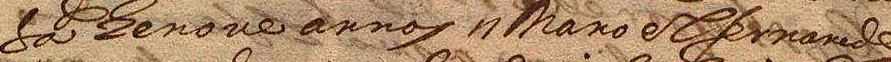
ta he noue annos // Manoel fernamdes
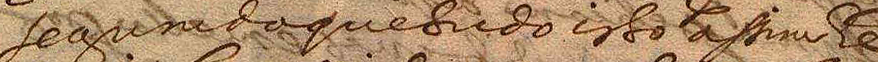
segumdo que tudo isto assim he
